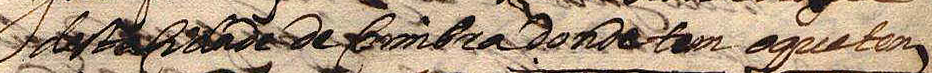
desta Cidade de Coimbra donde tem o que tem
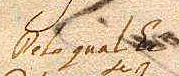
Pelo qual hé
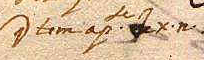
q̄ tem a p.te de x. n.
